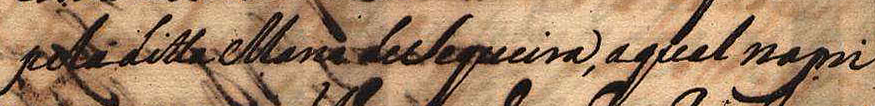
pela ditta Maria de Sequeira, a qual na pri
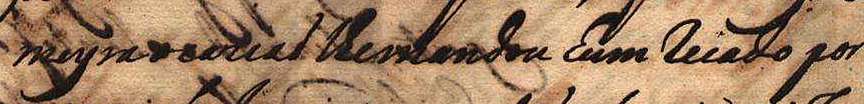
meyra ocaziaõ lhe mandou hum Recado por
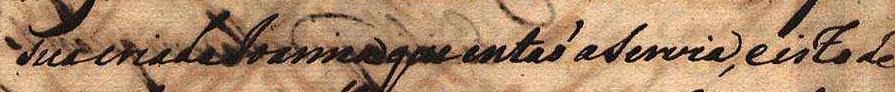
sua criada Ioanna que entaõ a servia, e isto de
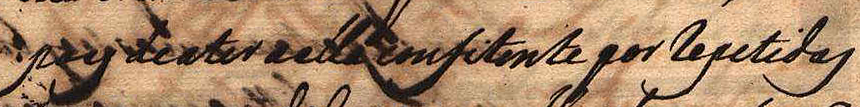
pois de a ter a ella confitente por Repetidas
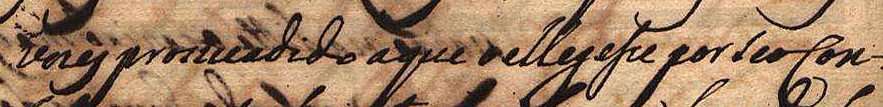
vezes prossuadido a que o ellegesse por seo Con
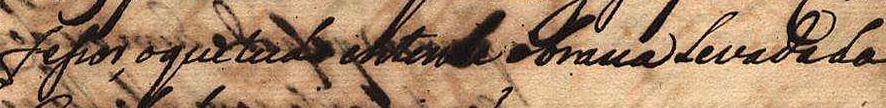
fessor, o que tudo entende obraua levada da
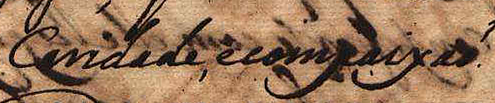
Caridade, e compaixaõ?
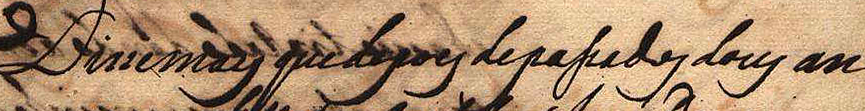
Disse mais que depoes de passados dous an
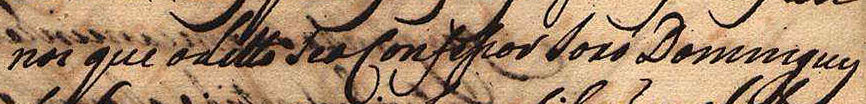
nos que o ditto seo Confessor Ioaõ Domingues
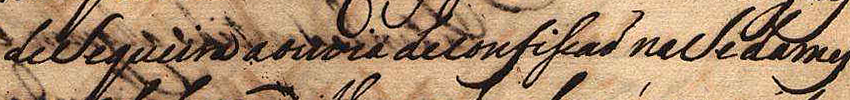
de Sequeira a ouvia de confissaõ na Se da mes
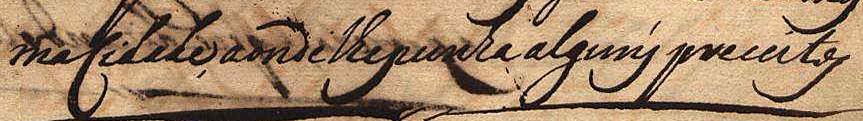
ma Cidade, aonde lhe punha algun̄s preceitos
